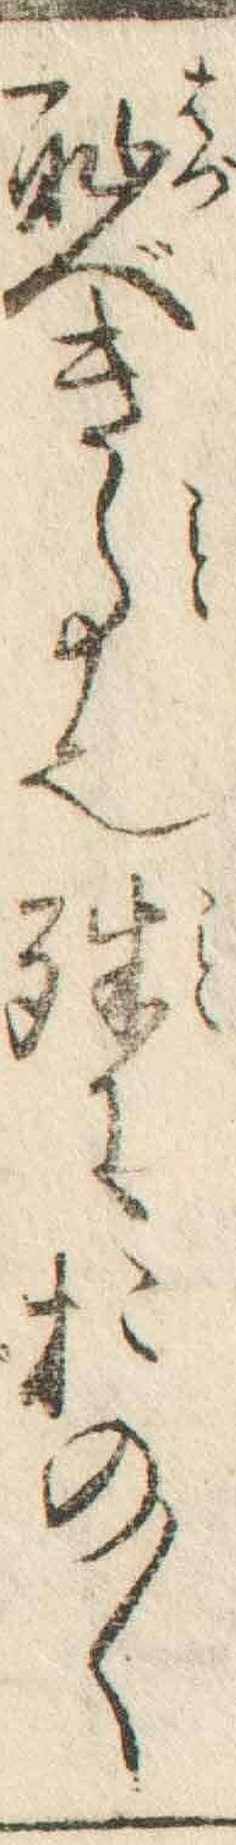恥べき事也殊におの〳〵
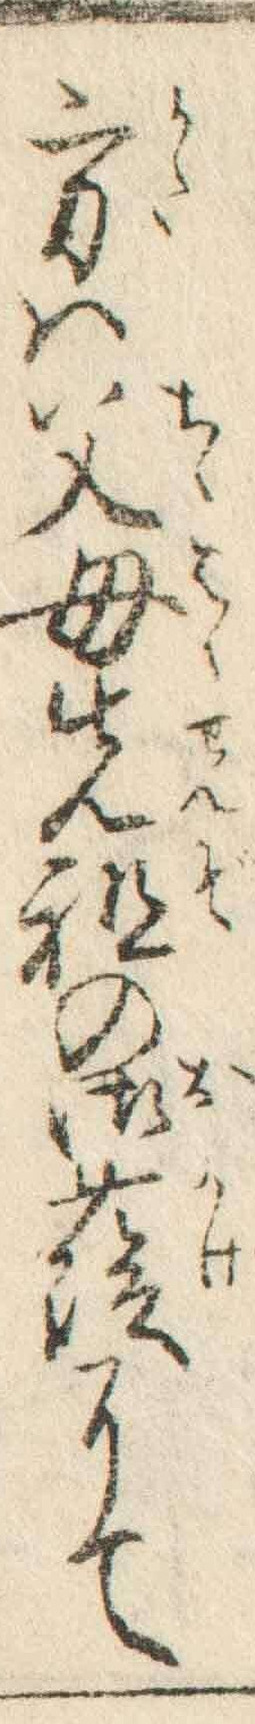方は父母先祖の御蔭にて
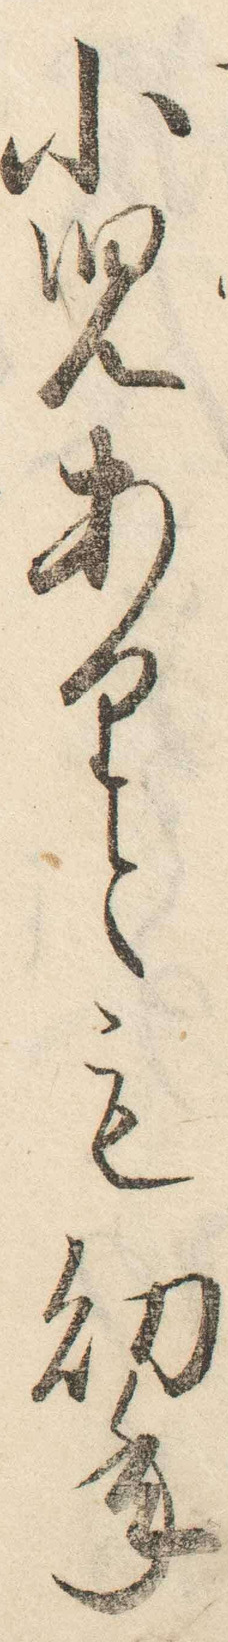小児ありとも幼年
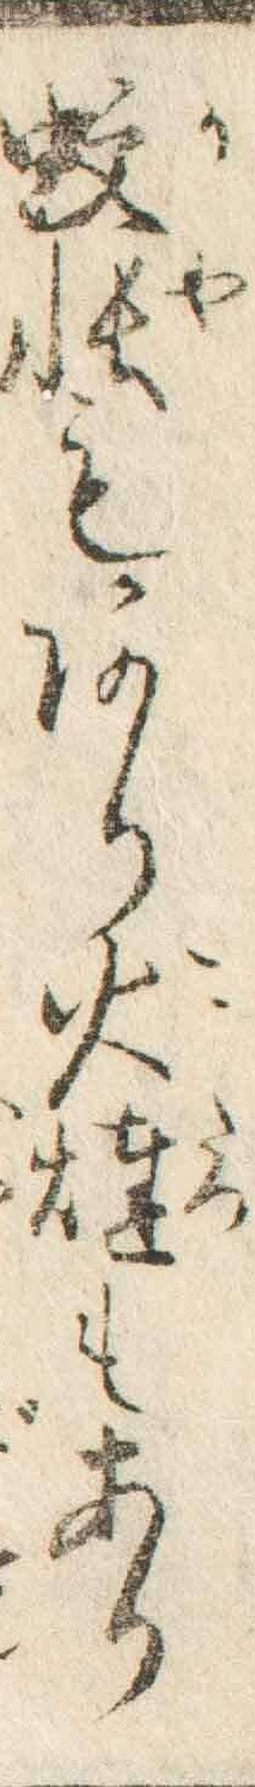蚊帳もあり火燵もあり
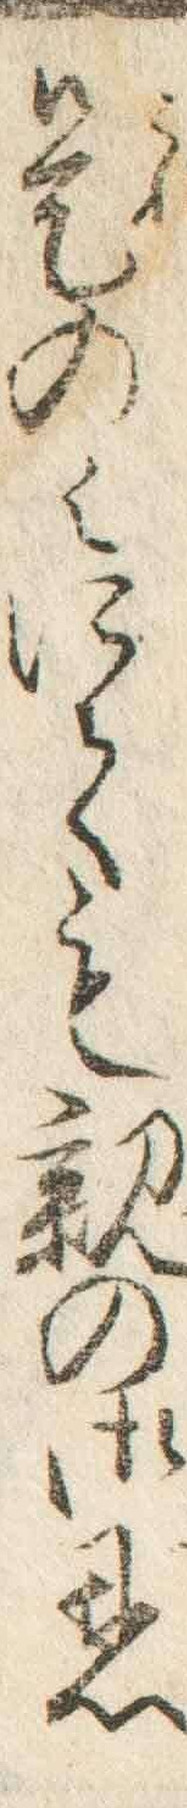是のみにても親の御恩
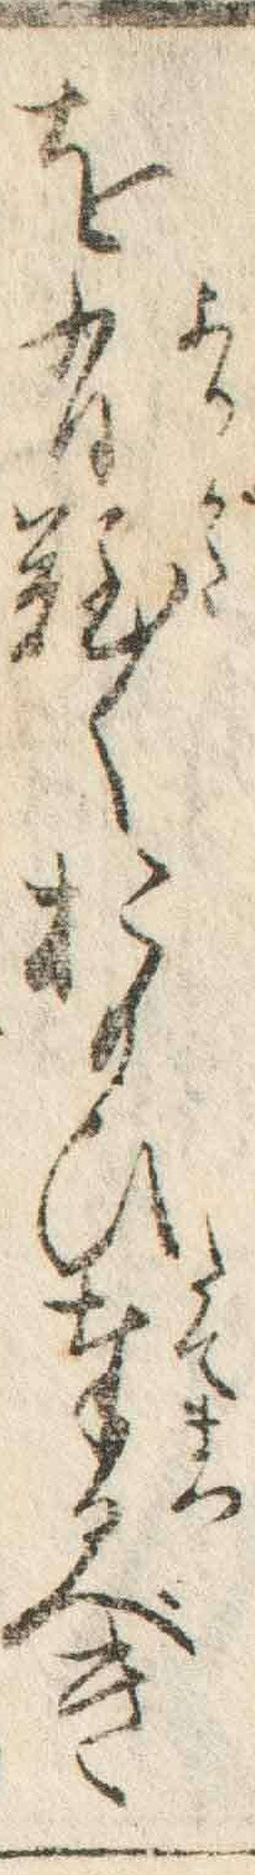を有難くおもひ奉るべき
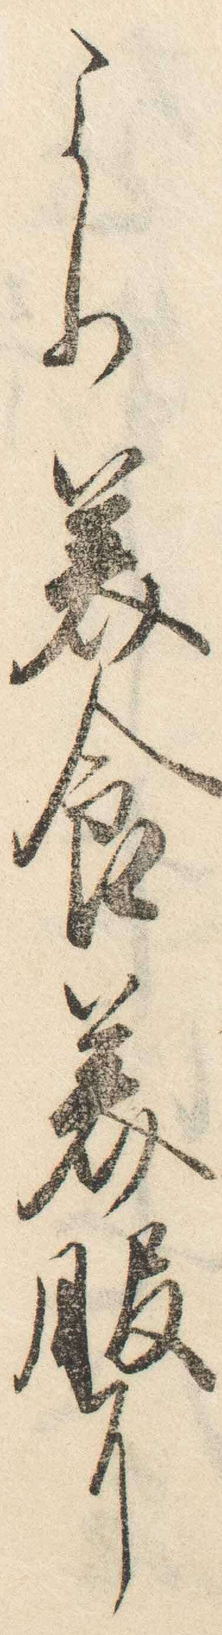より美食美服に
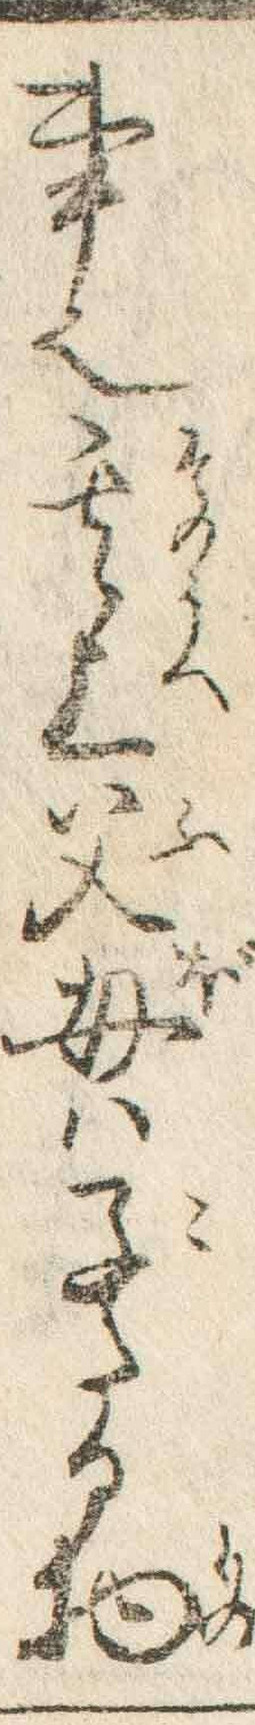事也其上父母は子たる物
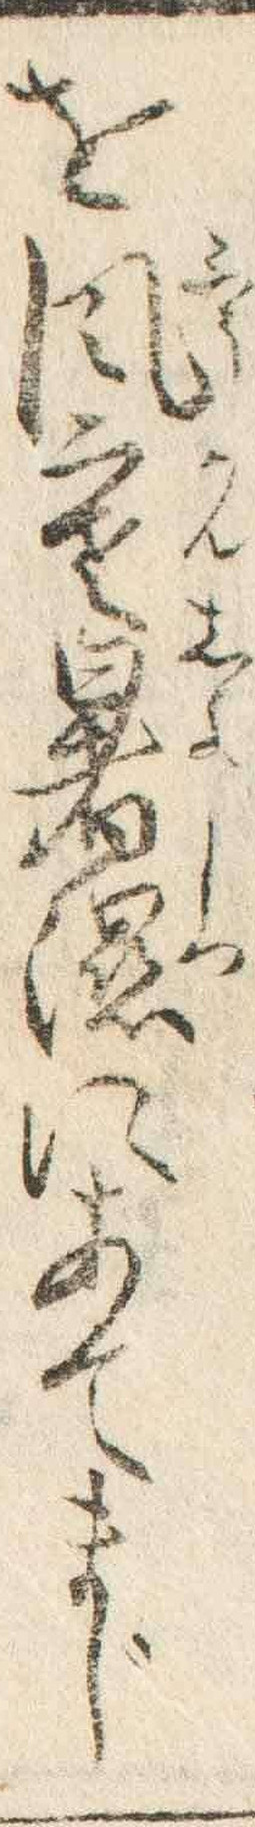を風寒暑湿にあてまじ
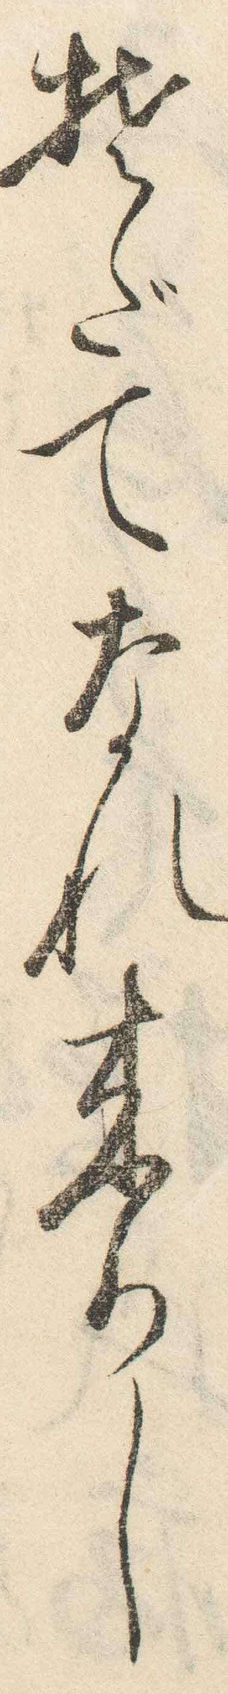そだてなれ来りし
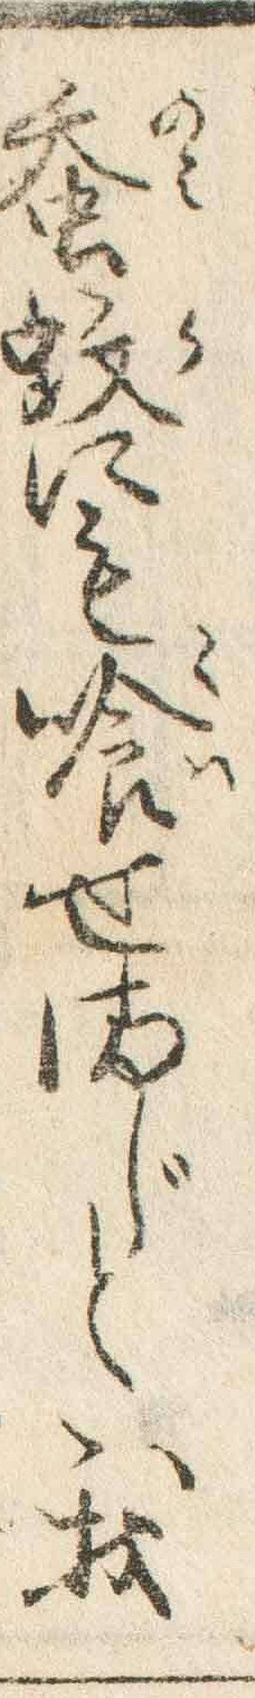蚤蚊にも喰せまじと我
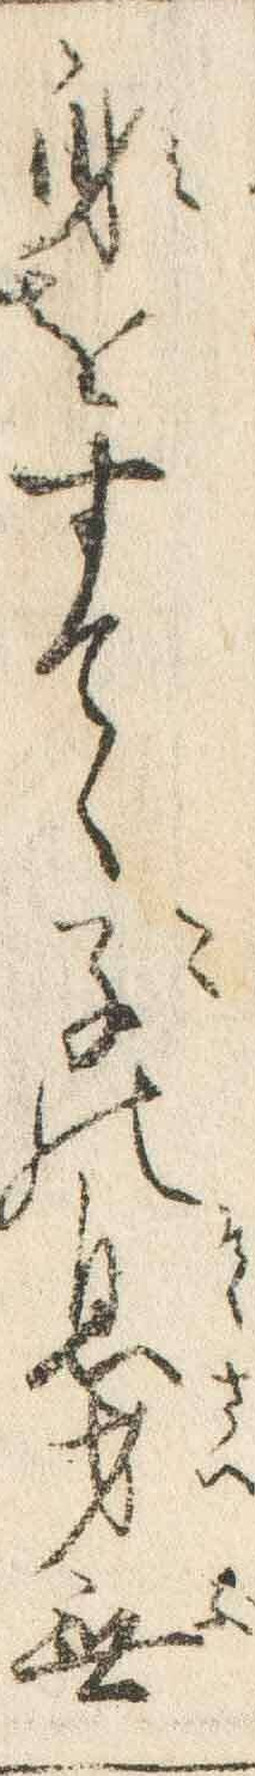身をすてゝ子の息才無
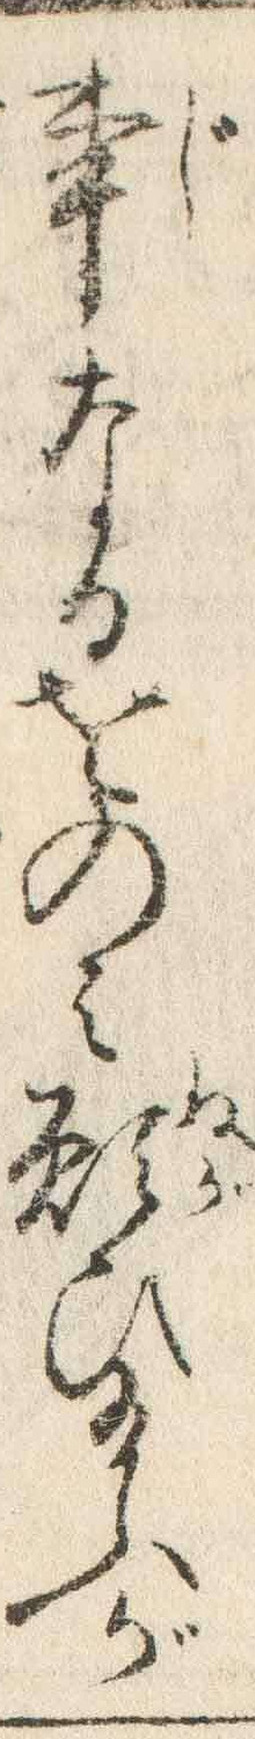事なるをのみ願ひ給ふが
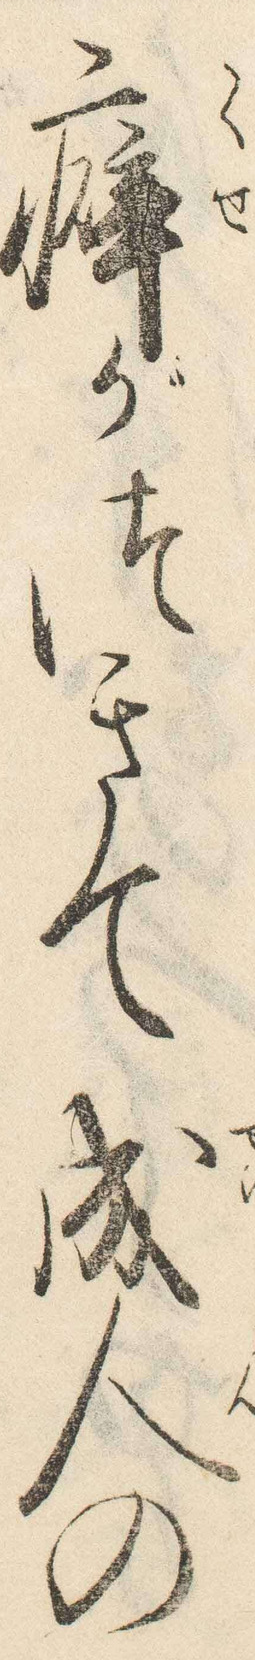癖がつきて成人の
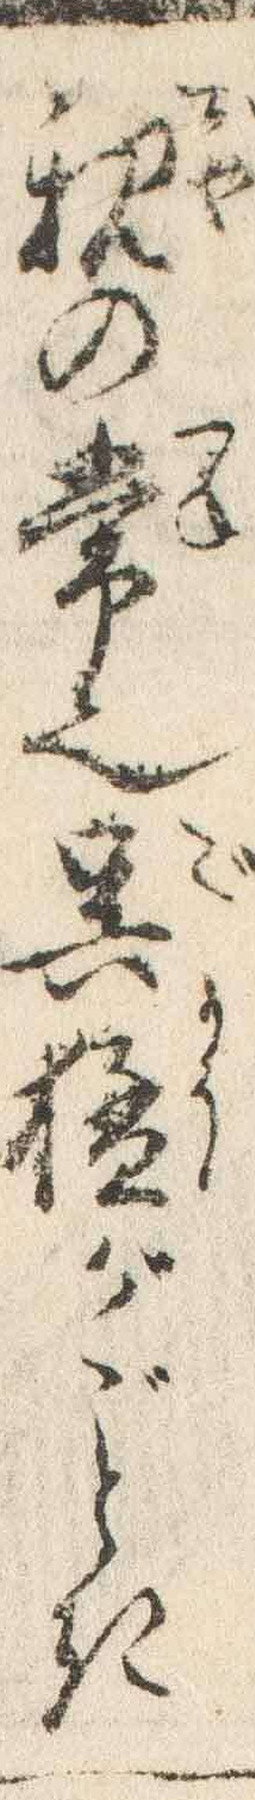親の常也呉猛がごとき
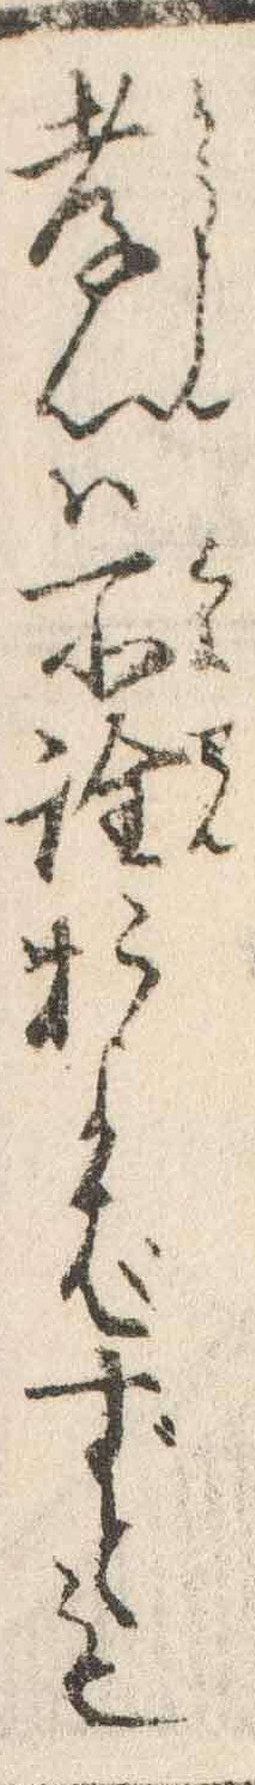孝心は所詮およばずとも
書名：撫育草
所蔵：東京学芸大学附属図書館 国文学研究資料館
